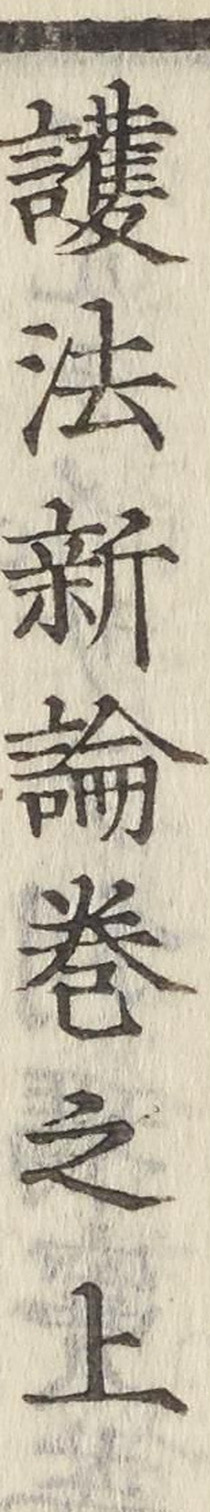護法新論巻之上
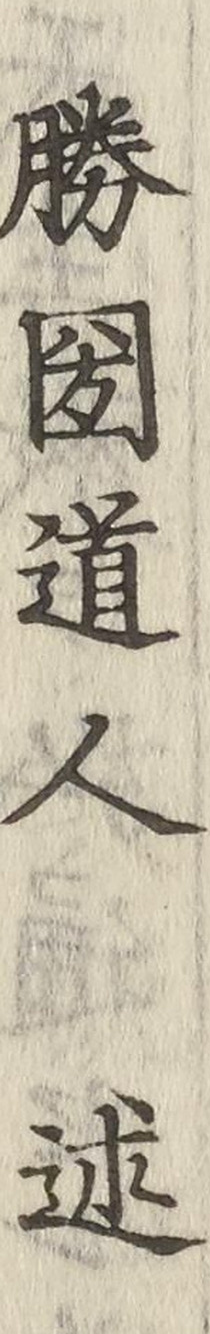勝圀道人述
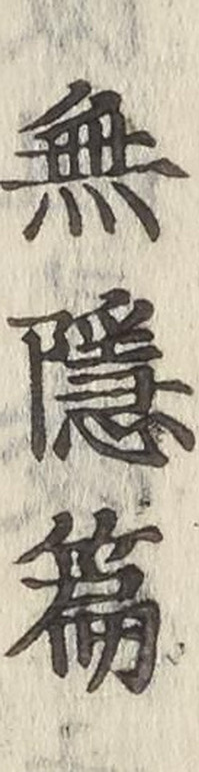無隠篇
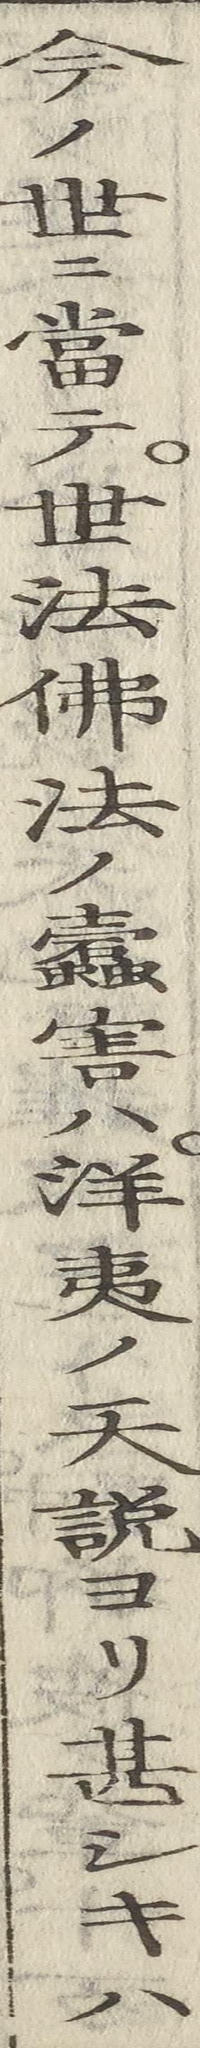今ノ世ニ当テ。世法仏法ノ蠧害ハ。洋夷ノ天説ヨリ甚シキハ
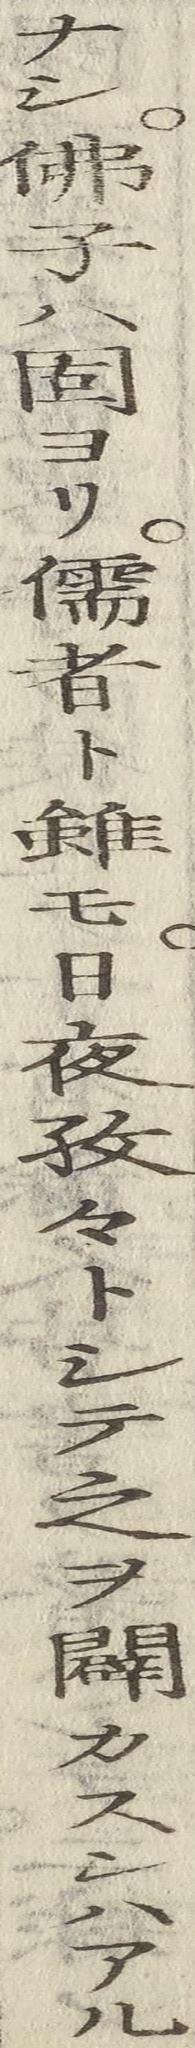ナシ。仏子ハ固ヨリ。儒者ト雖モ。日夜孜々トシテ之ヲ闢カスンハアル
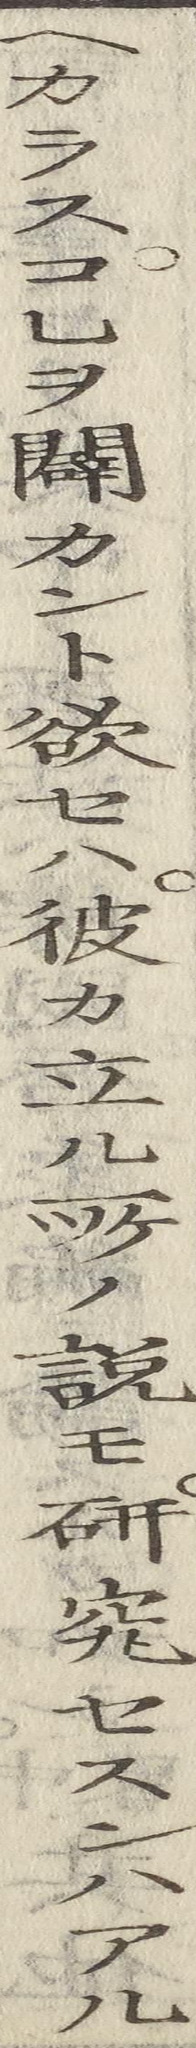ヘカラス。コレヲ闢カント欲セハ。彼カ立ル所ノ説モ。研究セスンハアル
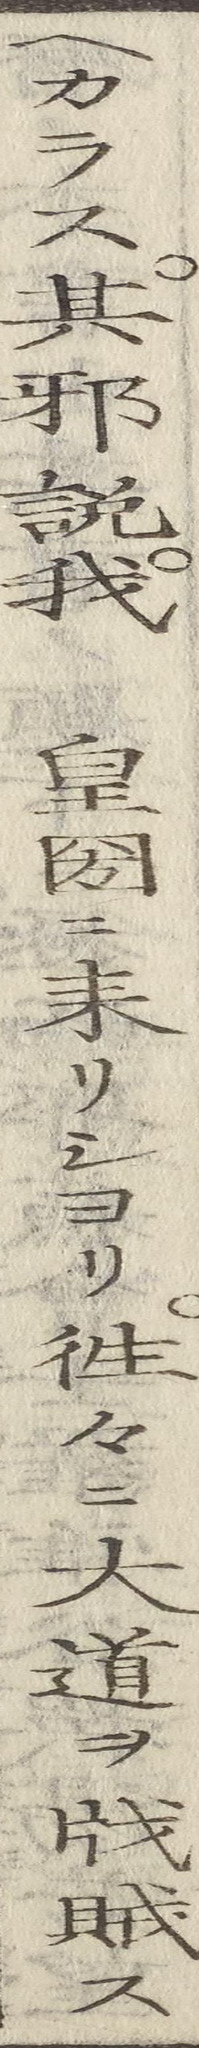ヘカラス。其邪説。我皇圀ニ来リシヨリ。往々ニ大道ヲ戕賊ス
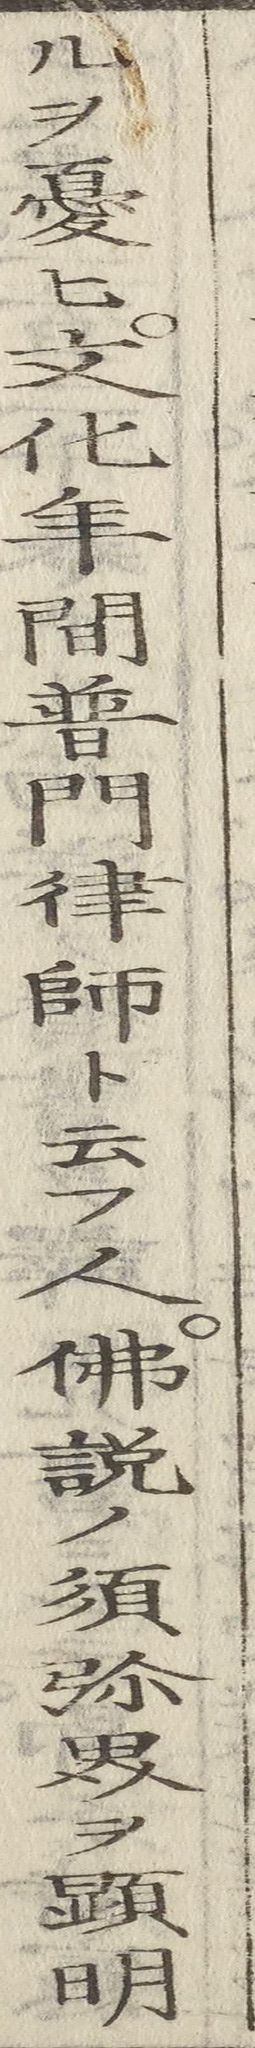ルヲ憂ヒ。文化年間普門律師ト云フ人。仏説ノ須弥界ヲ顕明
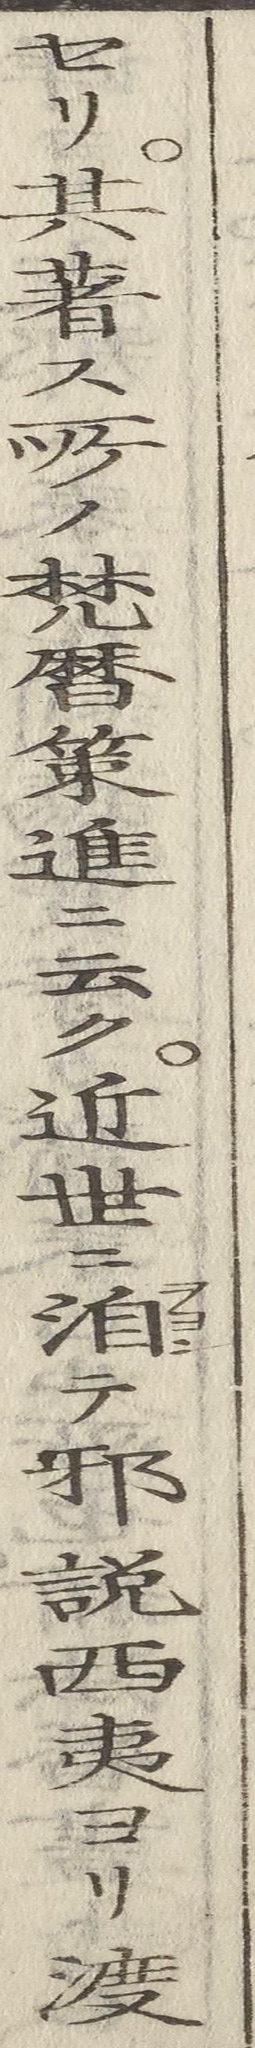セリ。其著ス所ノ梵暦策進ニ云ク。近世ニ洎テ邪説西夷ヨリ渡
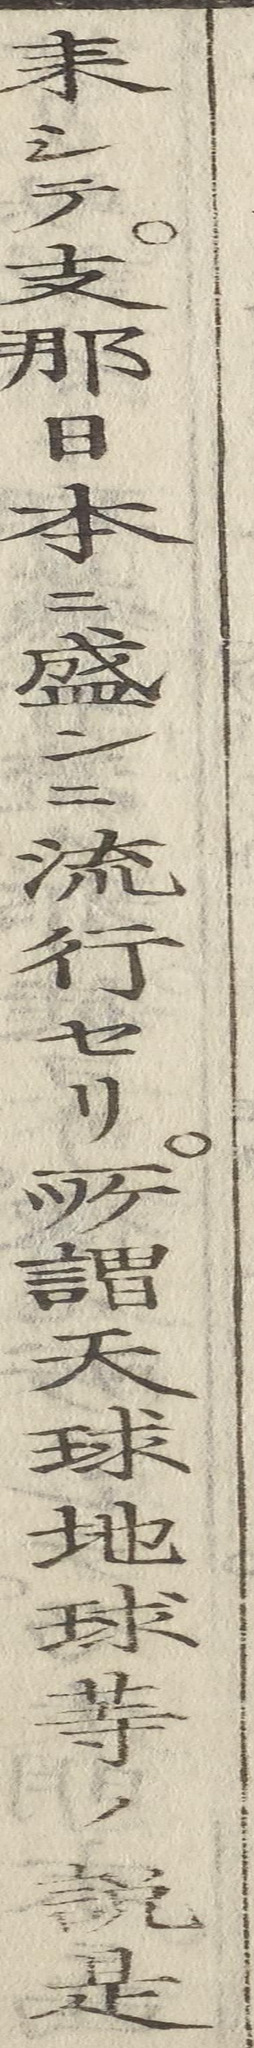来シテ。支那日本ニ盛ンニ流行セリ。所謂天球地球等ノ説是

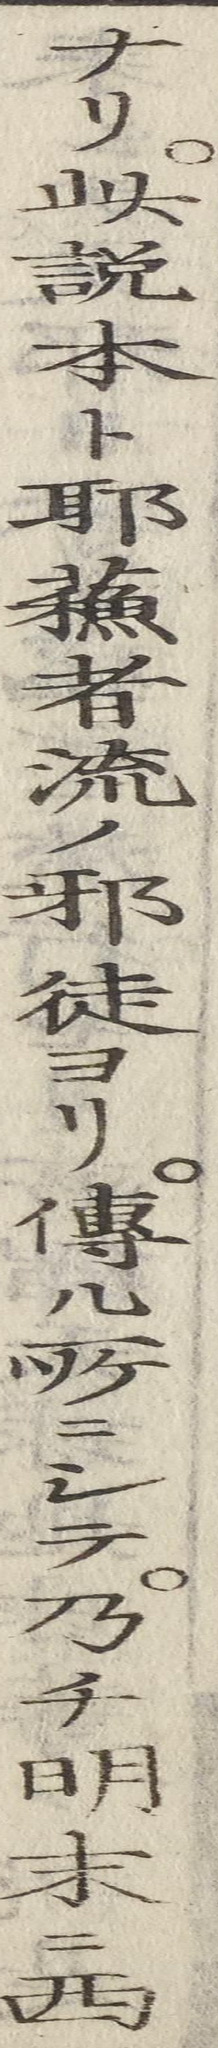ナリ。此説本ト耶蘇者流ノ邪徒ヨリ。伝ル所ニシテ。乃チ明末ニ西
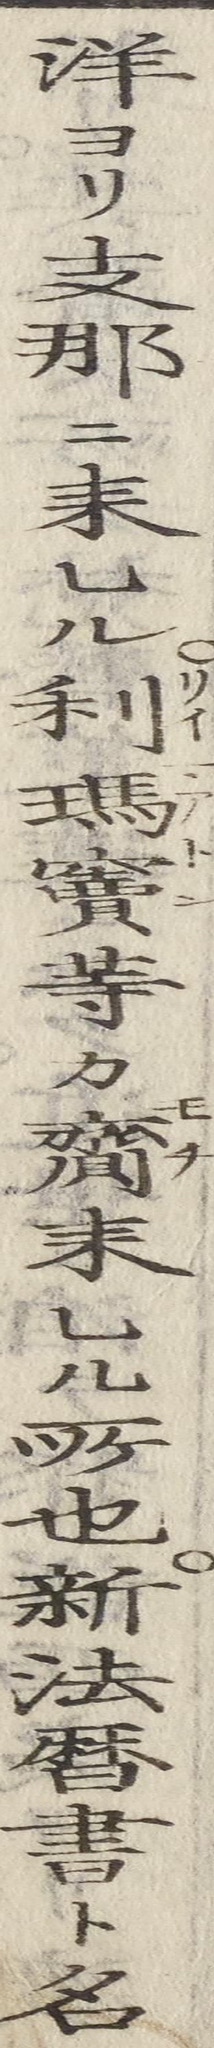洋ヨリ支那ニ来レル。利瑪竇等カ齎来レル所也。新法暦書ト名
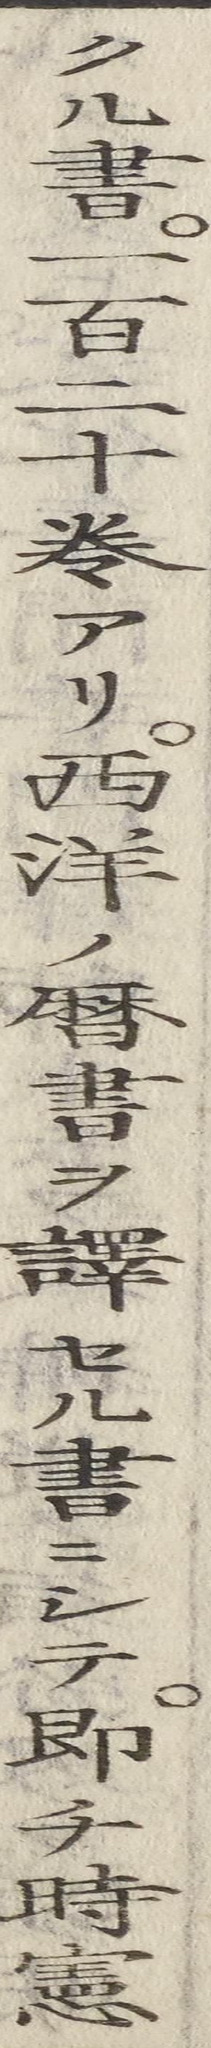タル書。一百二十巻アリ。西洋ノ暦書ヲ訳セル書ニシテ。即チ時憲
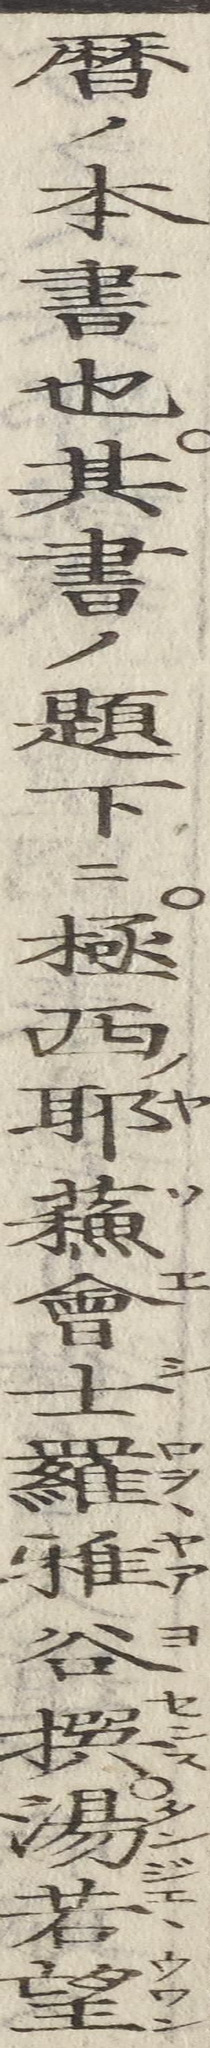暦ノ本書也。其書ノ題下ニ。極西耶蘇会士羅雅谷撰。湯若望
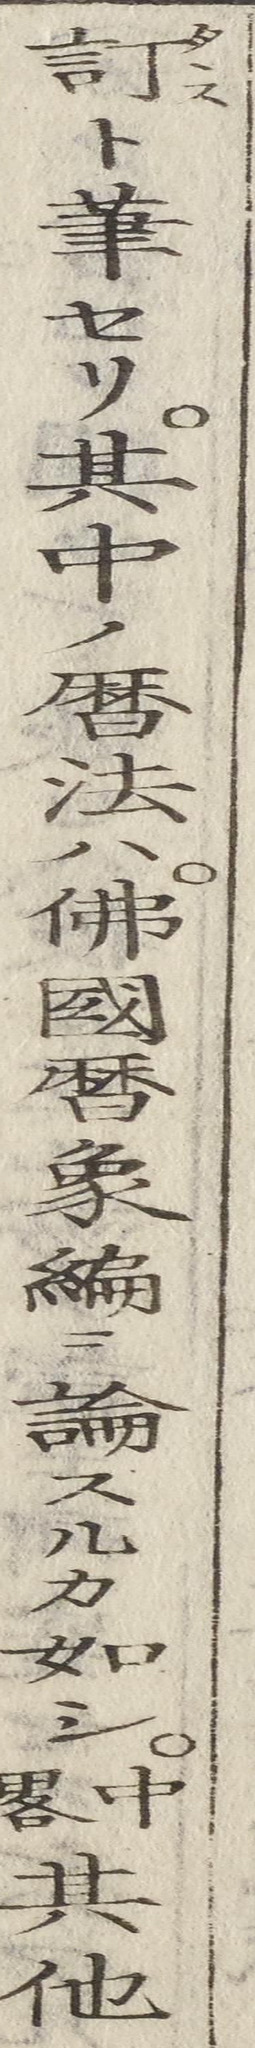訂ト筆セリ。其中ノ暦法ハ。仏国暦象編ニ論スルカ如シ。中略其他
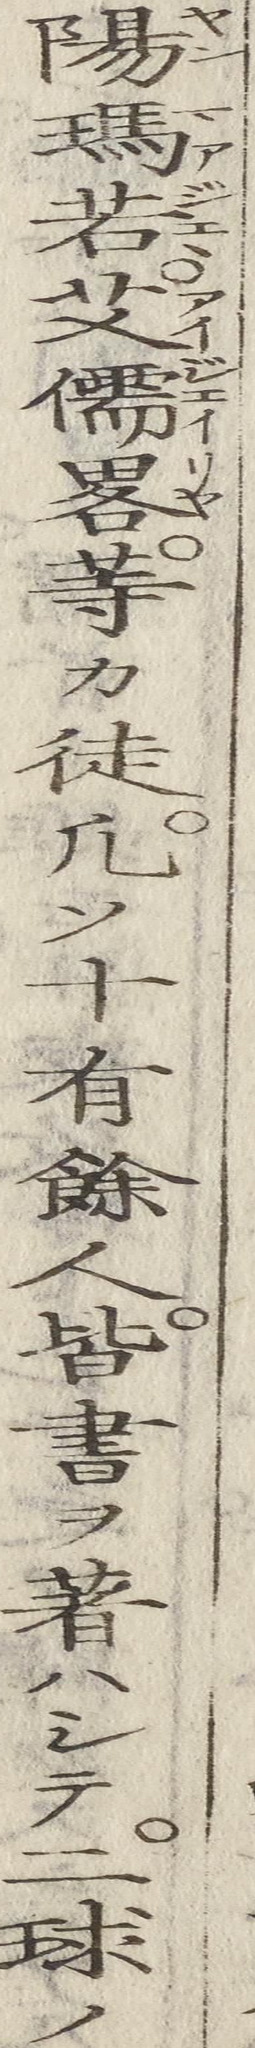陽瑪若。艾儒略。等カ徒。凡ソ十有余人。皆書ヲ著ハシテ。二球ノ
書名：護法新論　上
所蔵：東京大学地震研究所図書室 Earthquake Research Institute Library, The University of Tokyo, JAPAN
